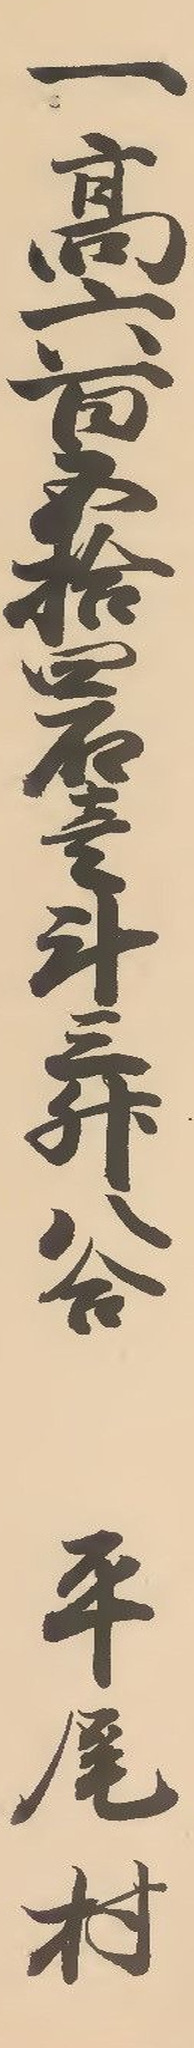一髙六百五拾四石壱斗三升八合平尾村
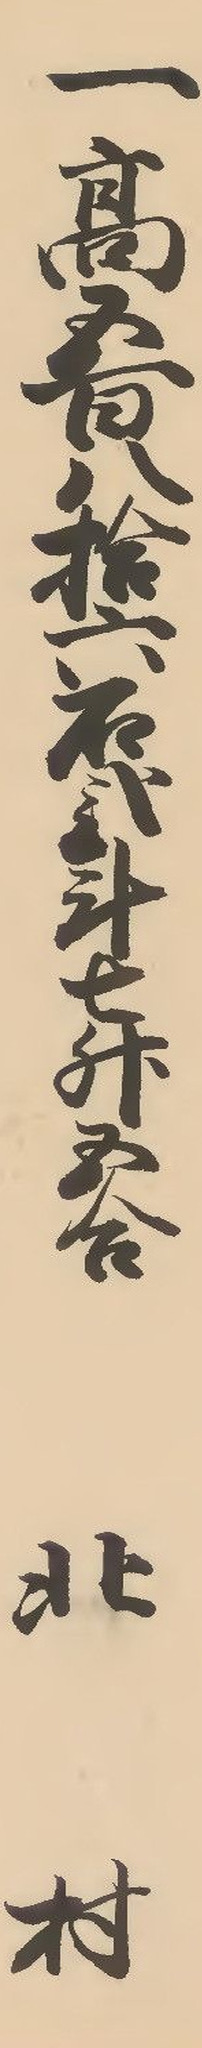一髙五百八拾六石弐斗七升五合北村
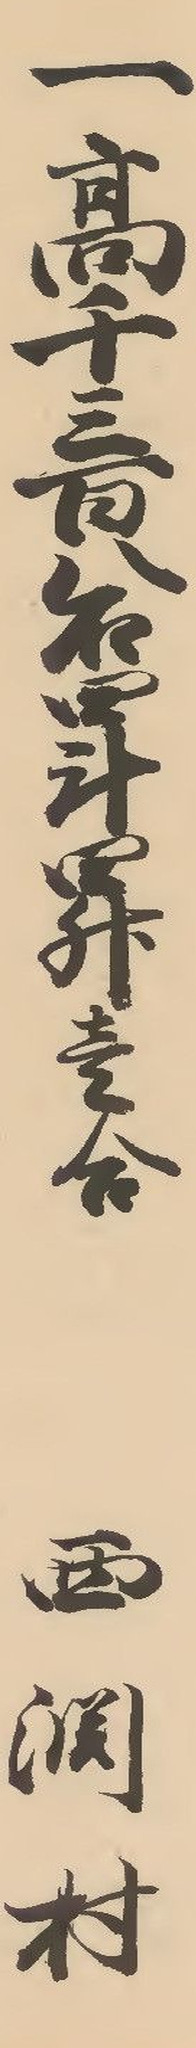一髙千三百八石四斗四升壱合西淵村
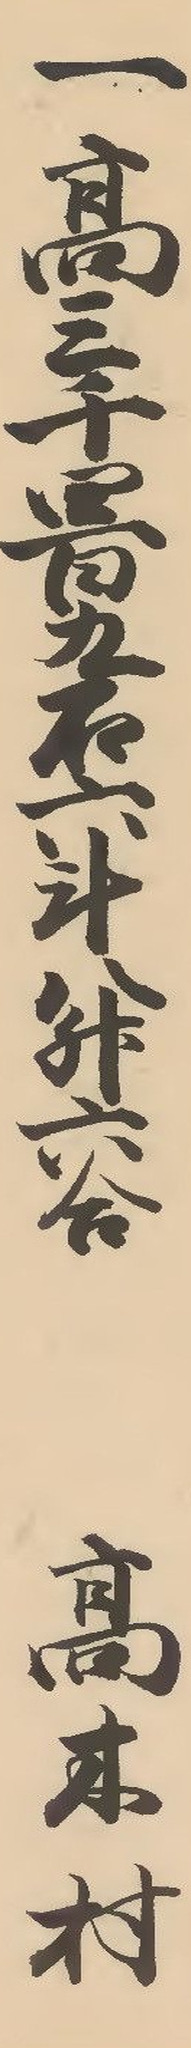一髙三千四百九石六斗八升六合高木村

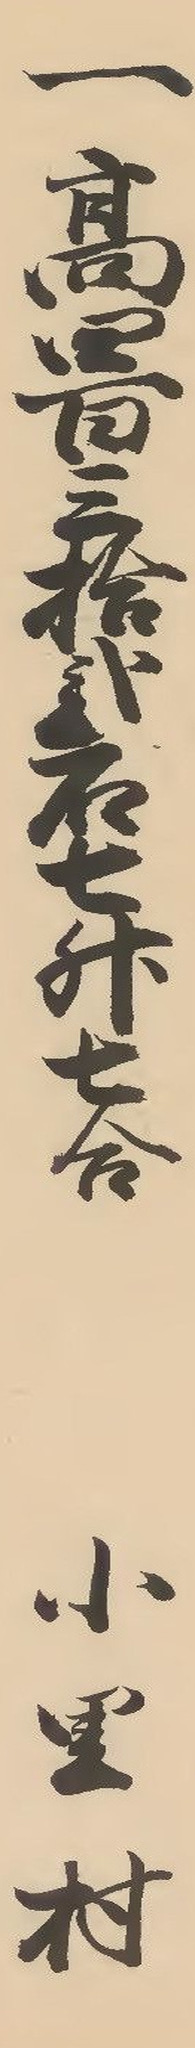一髙四百三拾弐石七升七合小里村
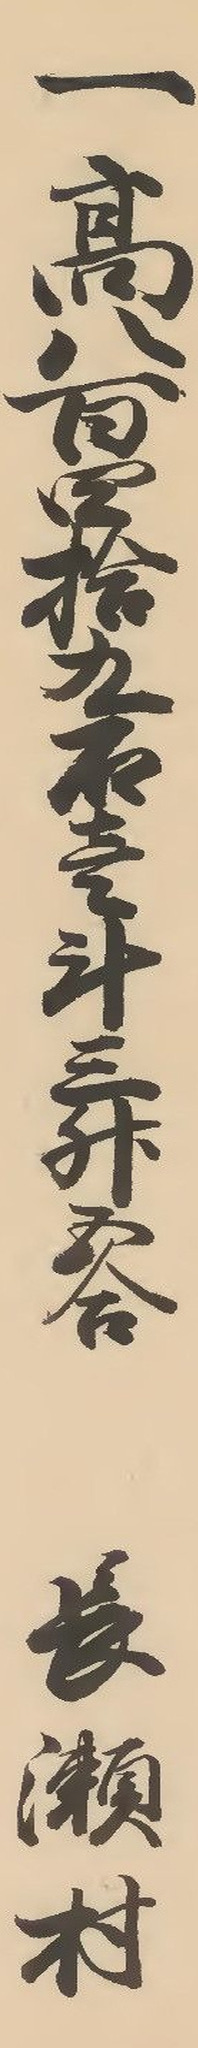一髙八百四拾九石壱斗三升五合長瀬村
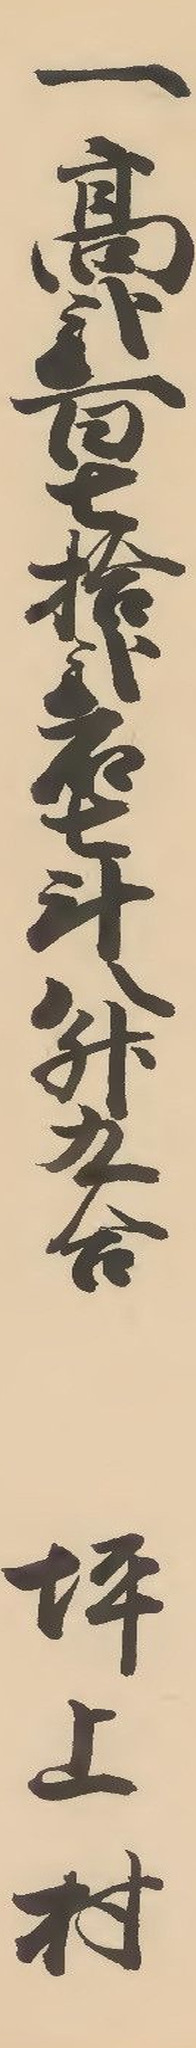一髙弐百七拾弐石七斗八升九合坪上村
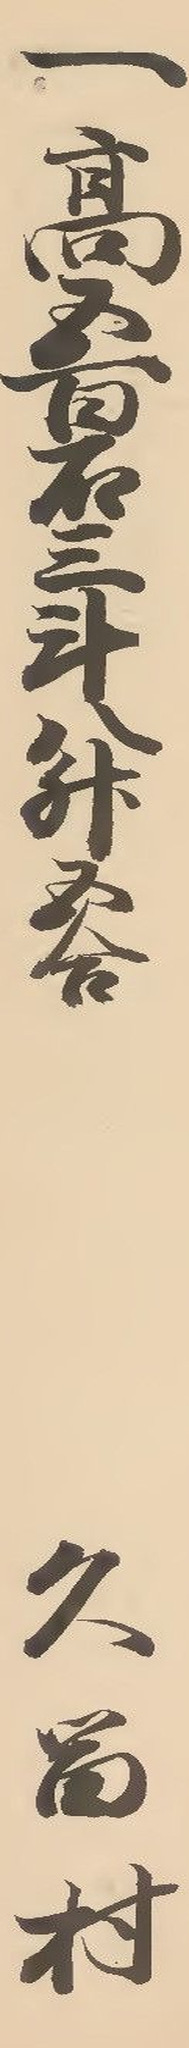一髙五百石三斗八升五合久冨村
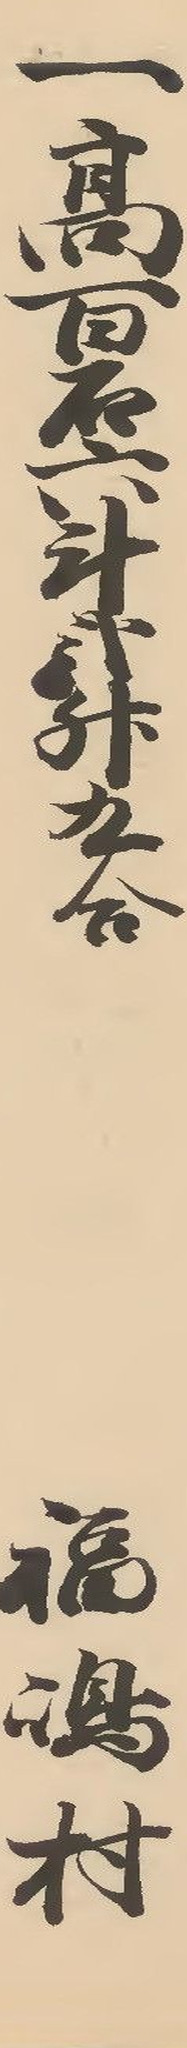一髙百石六斗弐升九合福嶋村
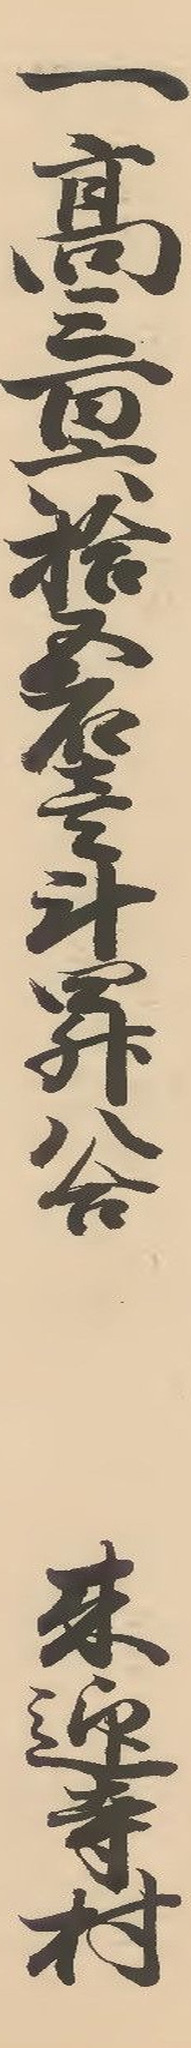一髙三百六拾五石壱斗四升八合来迎寺村
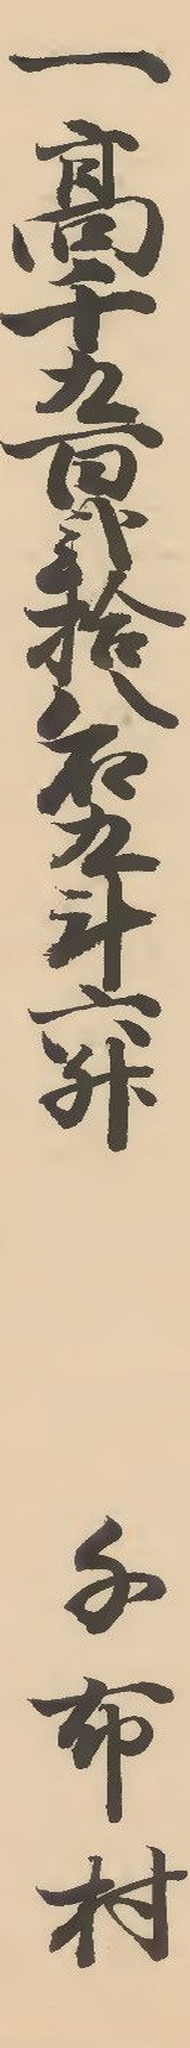一髙千九百弐拾八石九斗六升千布村

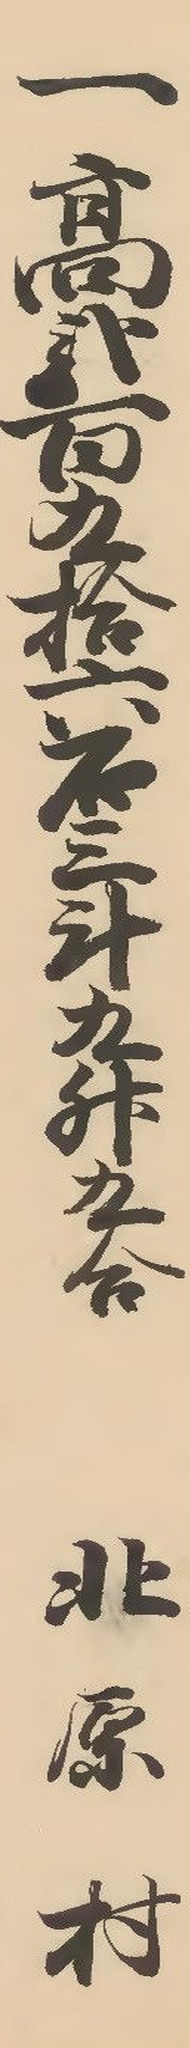一髙弐百九拾六石三斗九升九合北原村
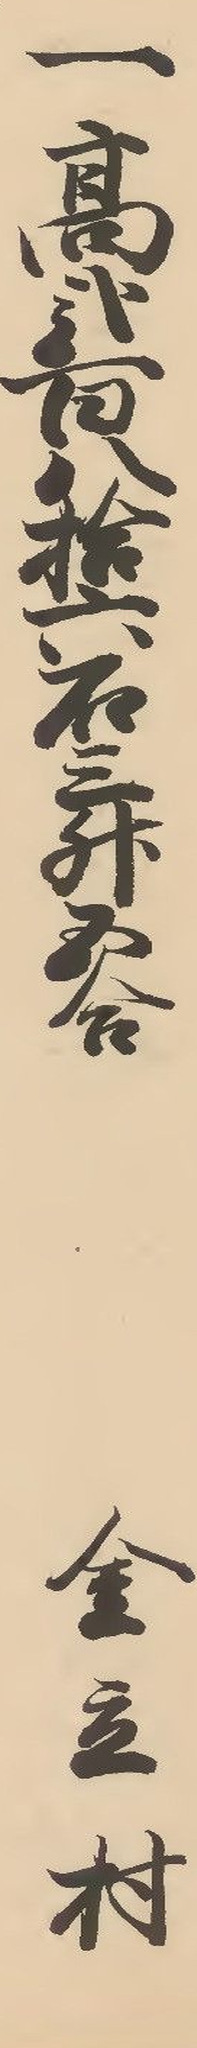一髙弐百八拾六石三升五合金立村
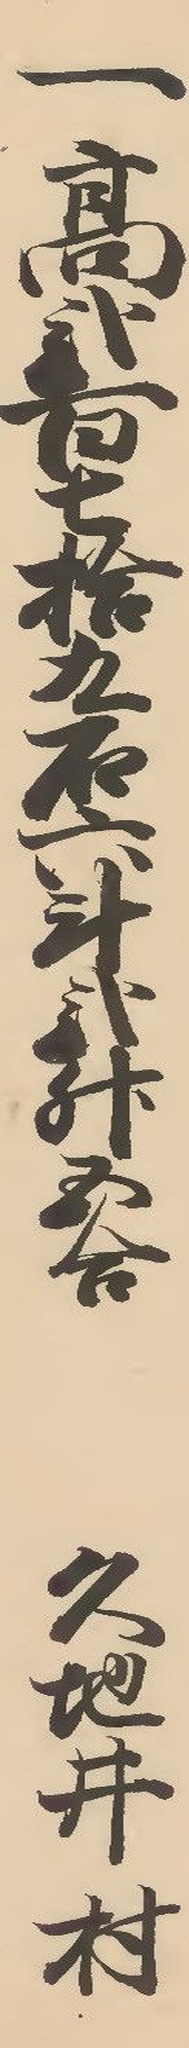一髙弐百七拾九石六斗弐升五合久地井村
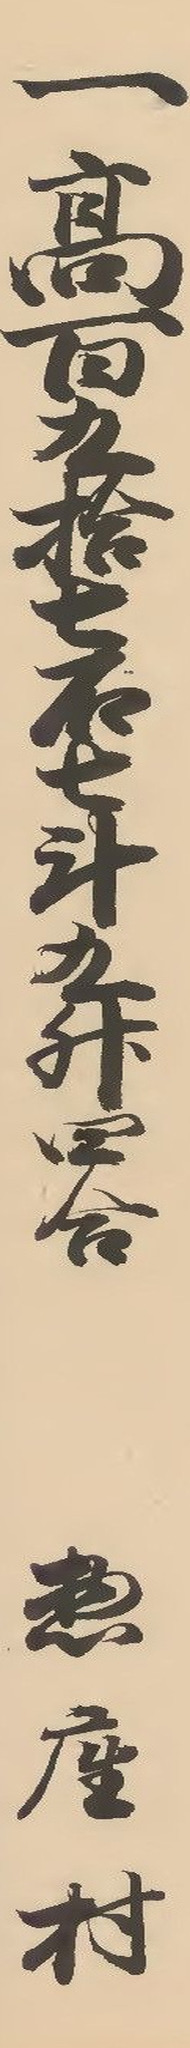一髙百九拾七石七斗九升四合惣座村
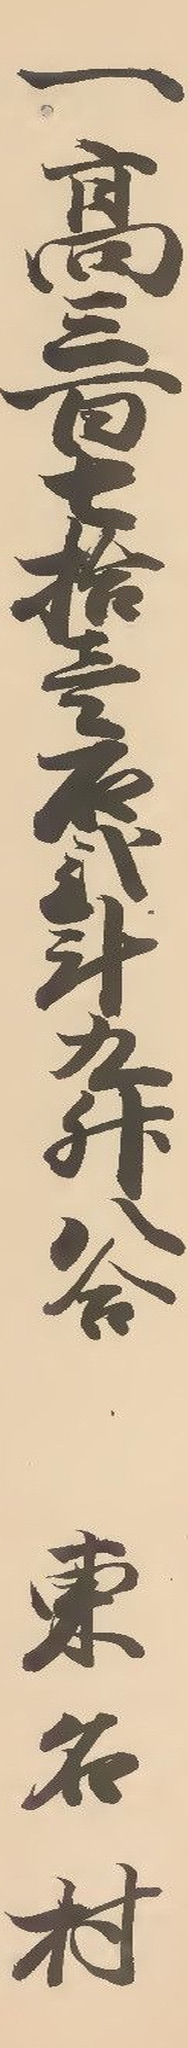一髙三百七拾壱石弐斗九升八合東名村
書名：肥前国郷帳
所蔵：国立公文書館 National Archives of Japan
